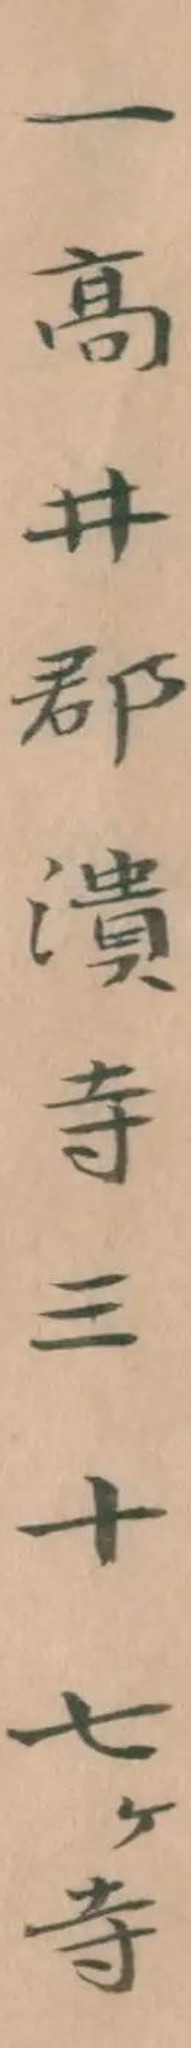一高井郡潰寺三十七ヶ寺
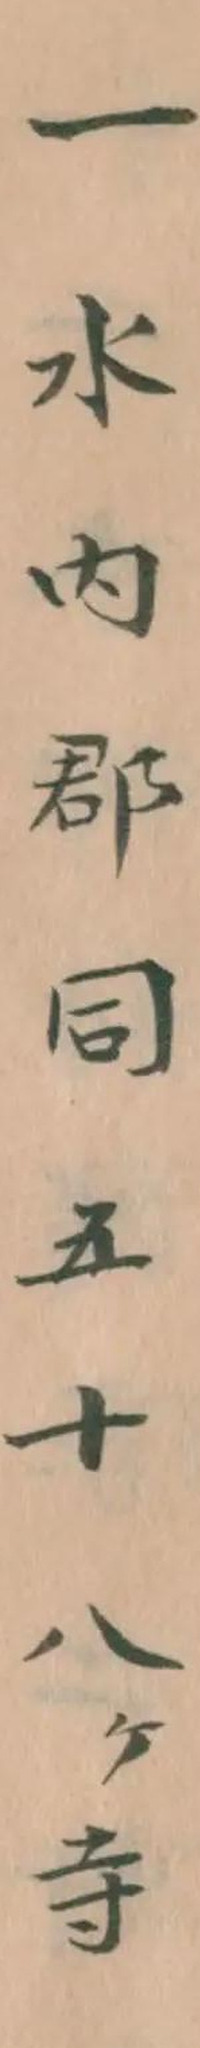一水内郡同五十八ヶ寺
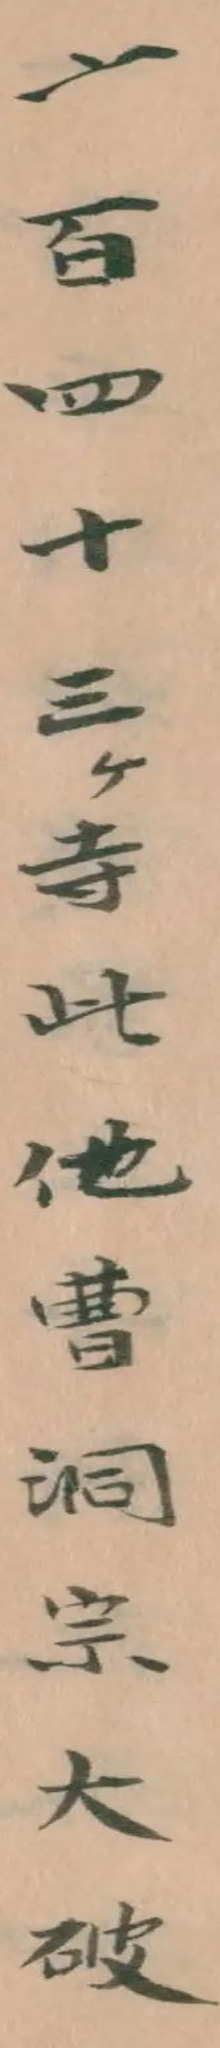〆百四十三ヶ寺此他曹洞宗大破
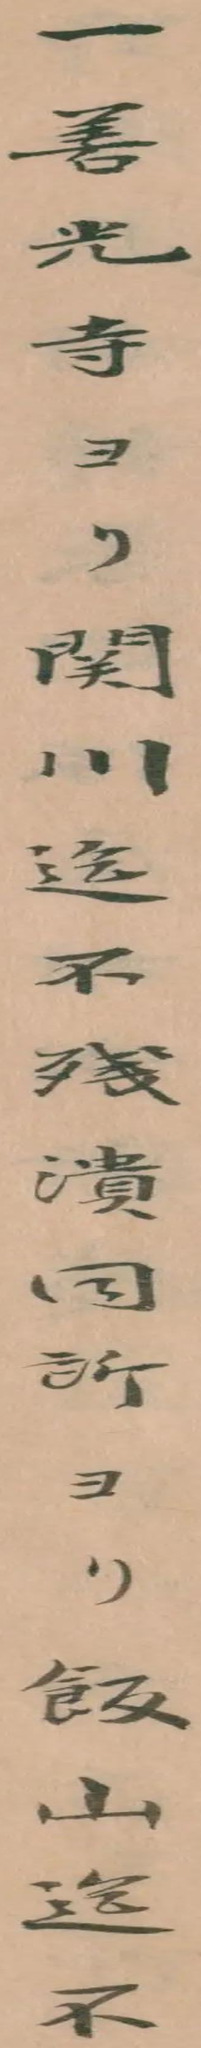一善光寺ヨリ関川迄不残潰同所ヨリ飯山迄不
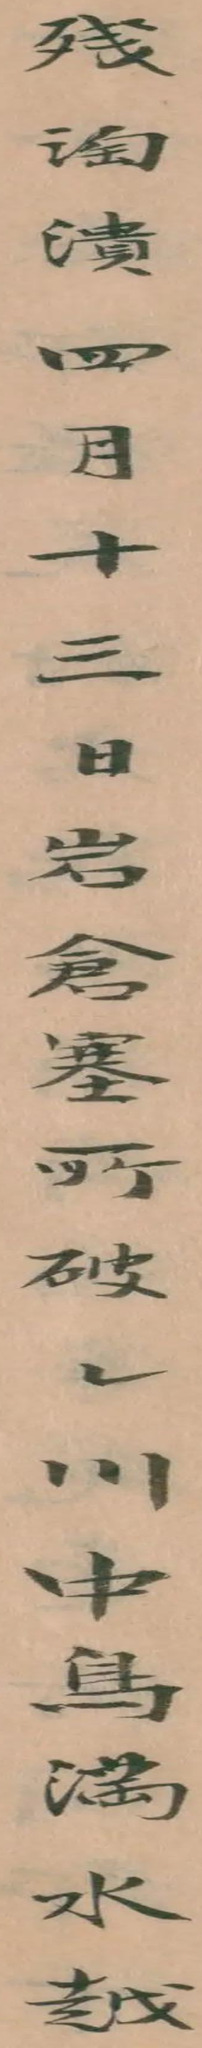残淘潰四月十三日岩倉塞所破レ川中鳥満水越
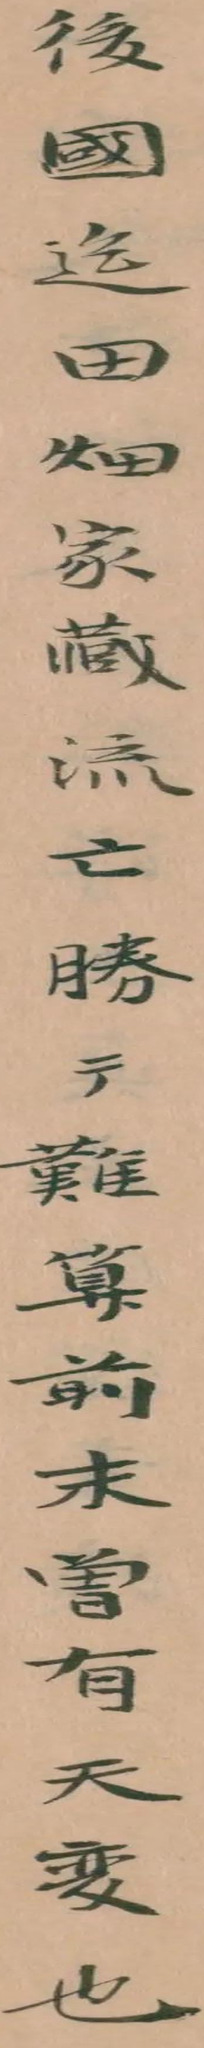後国迄田畑家藏流亡勝テ難算前未曾有天変也
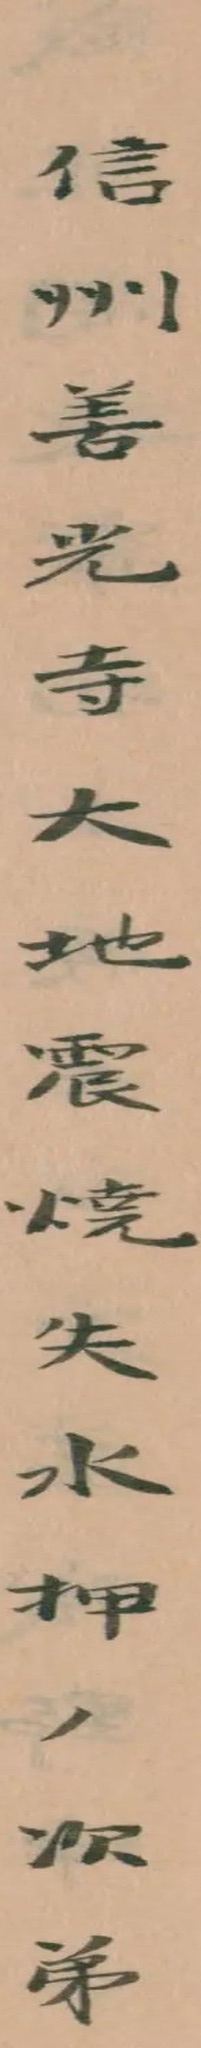信州善光寺大地震焼失水押ノ次第
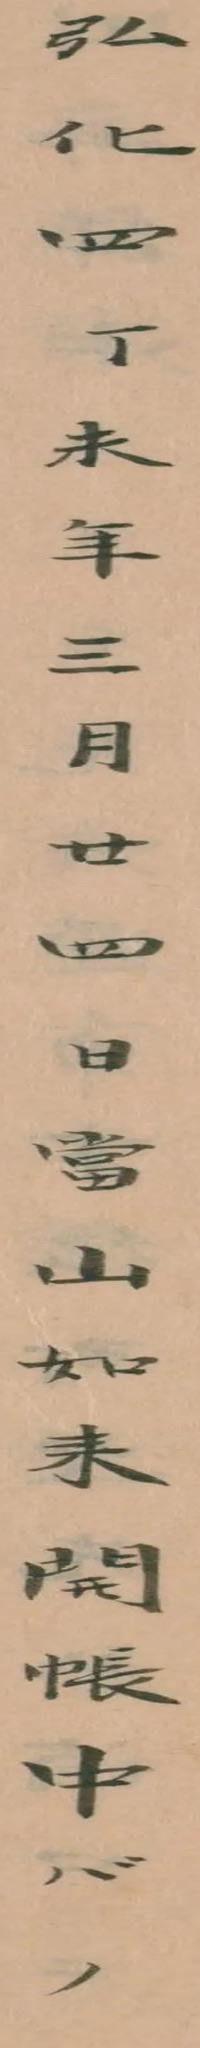弘化四丁未年三月廿四日当山如来開帳中バノ
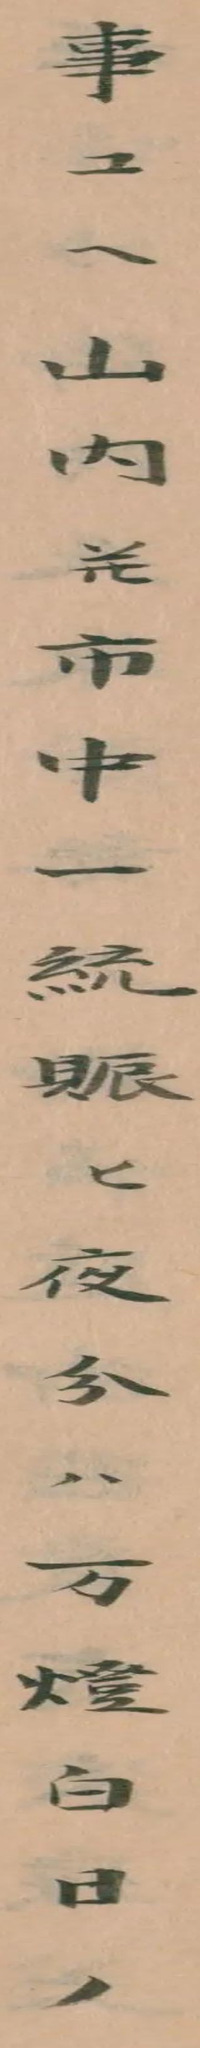事ユヘ山内并市中一統賑ヒ夜分ハ万灯白日ノ
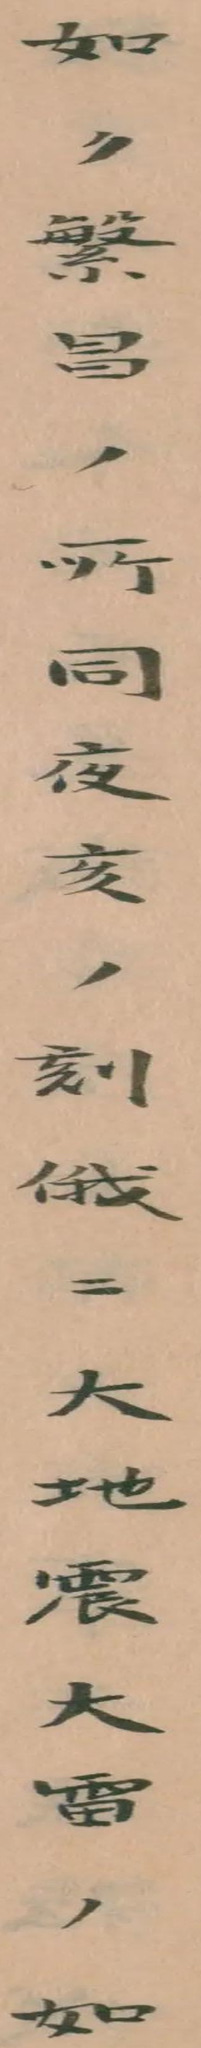如ク繁昌ノ所同夜亥ノ刻俄ニ大地震大雷ノ如
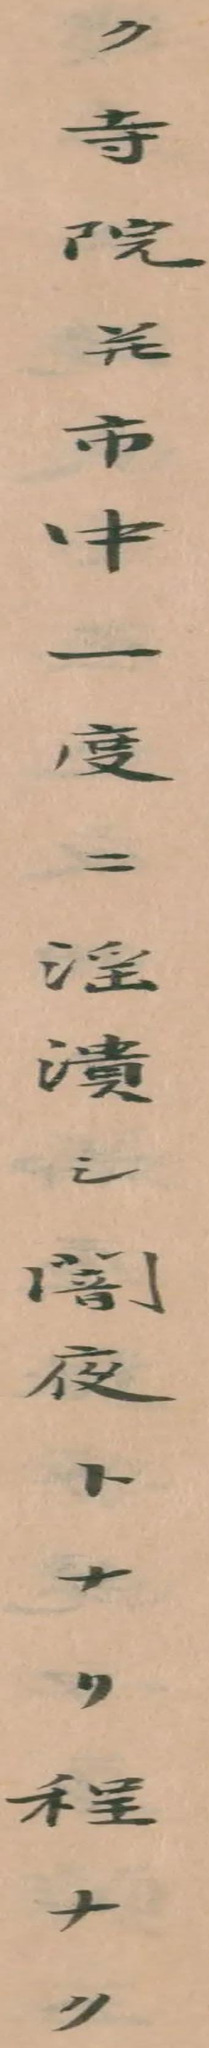ク寺院并市中一度ニ淘潰シ闇夜トナリ程ナク
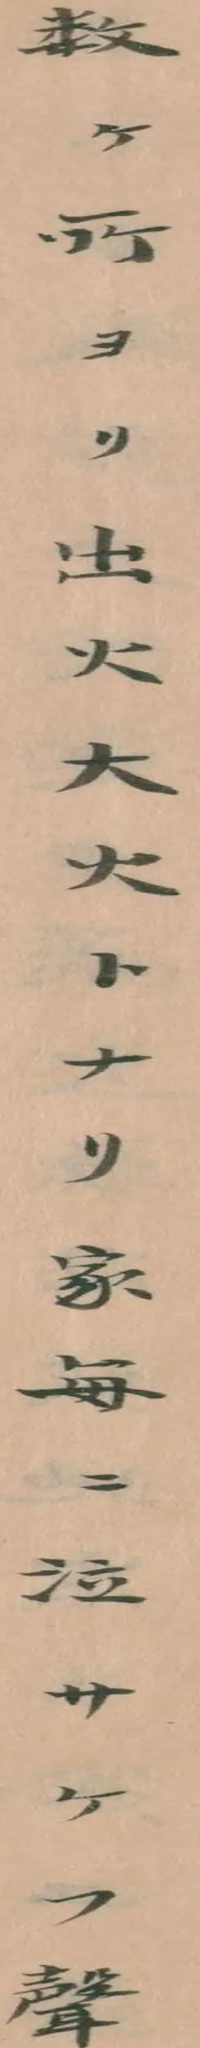数ヶ所ヨリ出火大火トナリ家毎ニ泣サケフ声
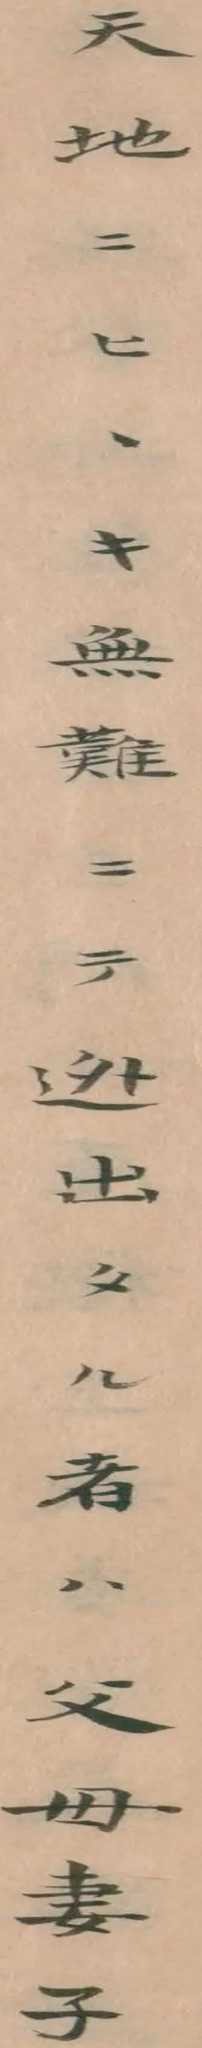天地ニヒヽキ無難ニテ逃出タル者ハ父母妻子
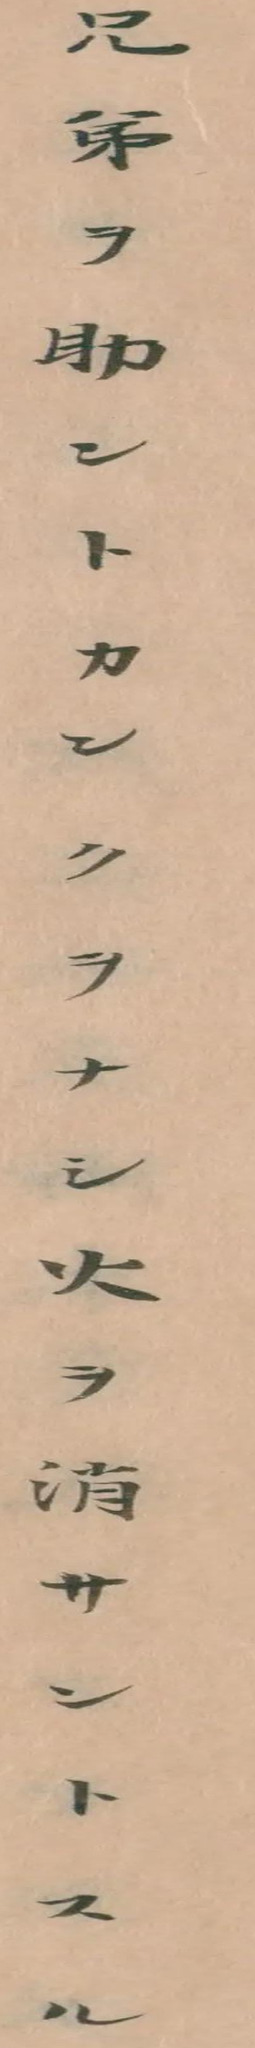兄弟ヲ助ントカンクヲナシ火ヲ消サントスル
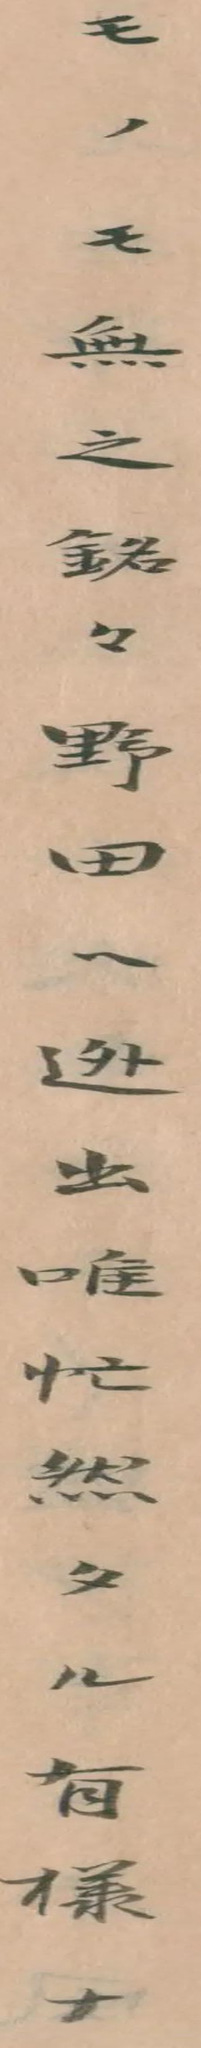モノモ無之銘々野田ヘ逃出唯忙然タル有様ナ
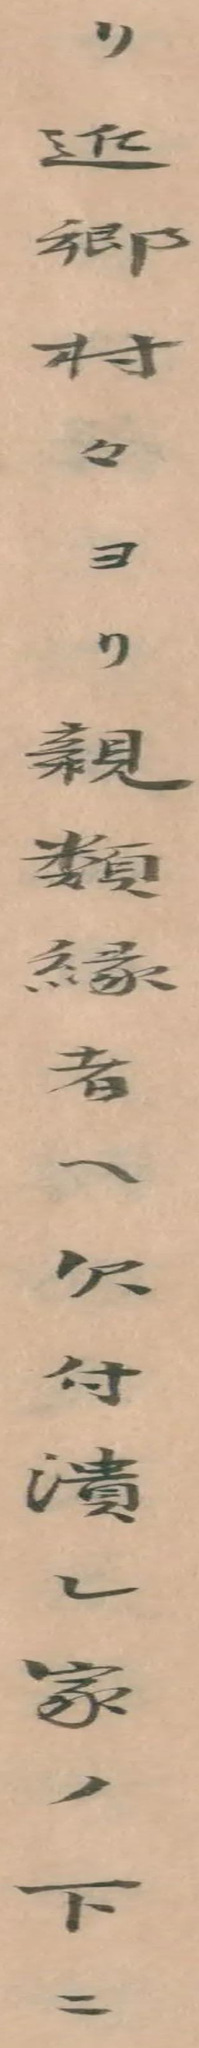リ近郷村々ヨリ親類縁者ヘ欠付潰家ノ下ニ
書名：地災撮要. 巻5-6(地震之部)
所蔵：国立国会図書館 National Diet Library, JAPAN
